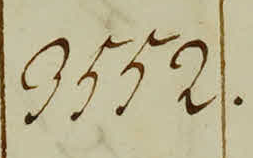3552
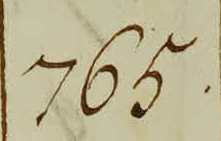765
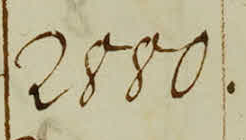2880
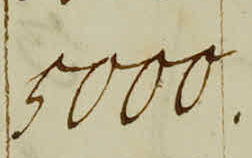5000
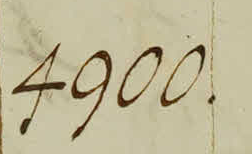4900.
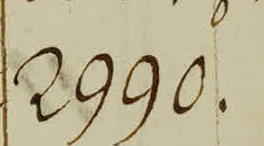2990.
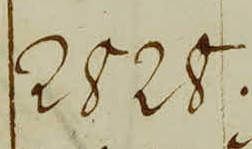2828
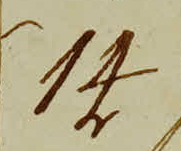14
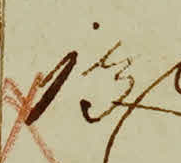13
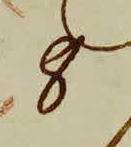8
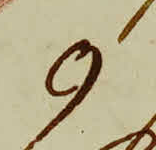9
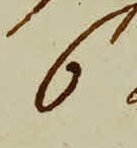6
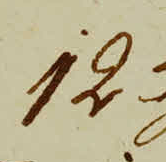12
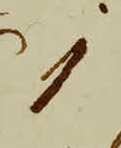1
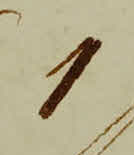1
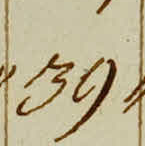39
